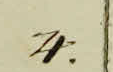4.
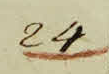24
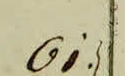61.
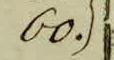60.
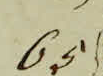65
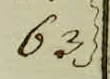63
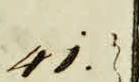41.
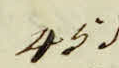45
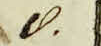8.
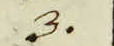3.
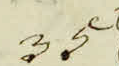35
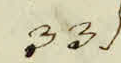33
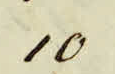10
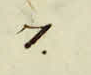7.
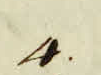4.
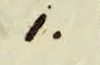1.
